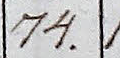74.
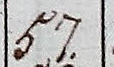57.
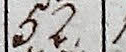52.
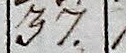37.
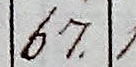67.
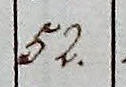52.
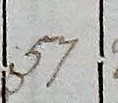57
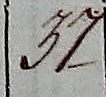37
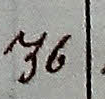36
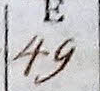49
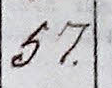57.
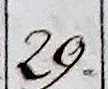29
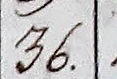36.
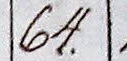64.
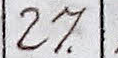27.
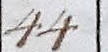44
